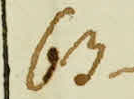63
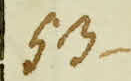53
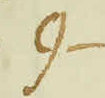9
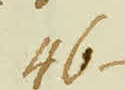46
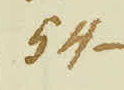54
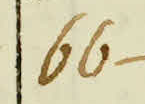66
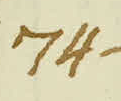74
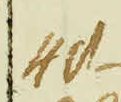48
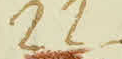22
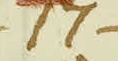77
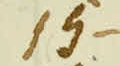15
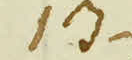13
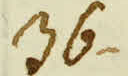36
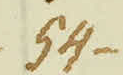54
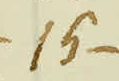15
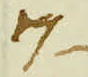7
